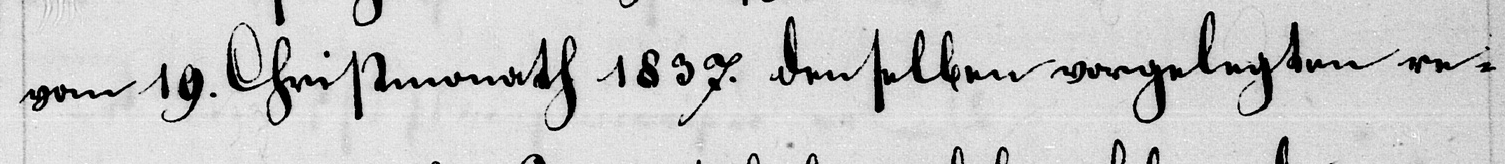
vom 19. Christmonath 1837. denselben vorgelegten re¬
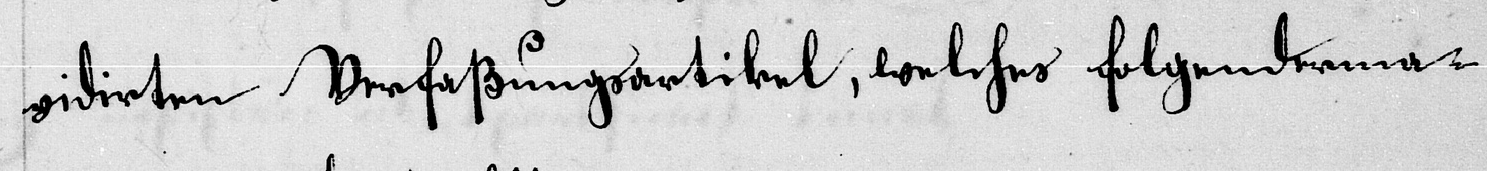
vidirten Verfaßungsartikel, welches folgenderma¬
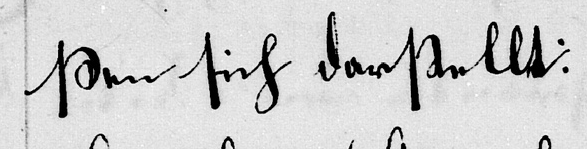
ßen sich darstellt:
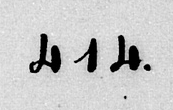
414.
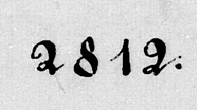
2812.
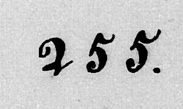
255.
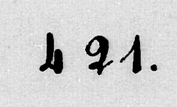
421.
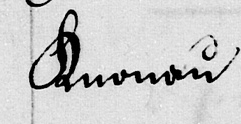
Knonau
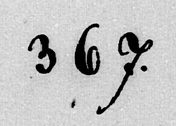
367.
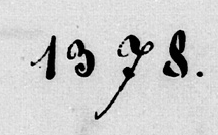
1378.
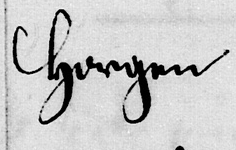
Horgen
